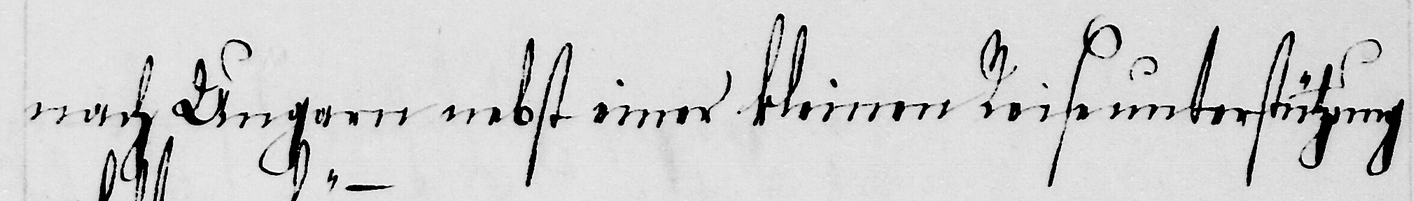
nach Ungarn nebst einer kleinen Reiseunterstützung
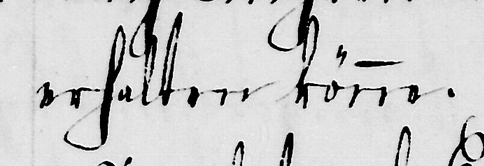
erhalten könne.
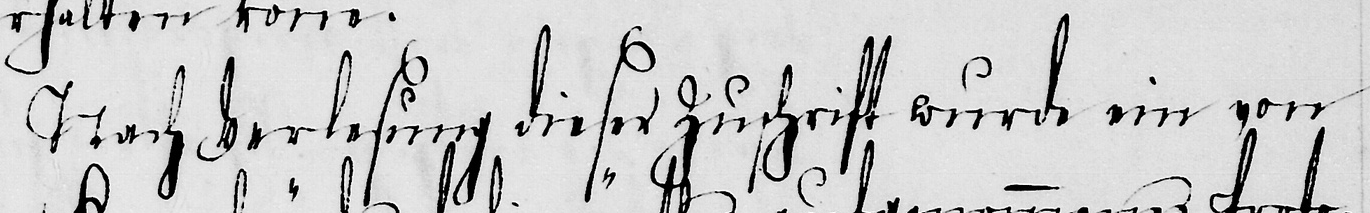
Nach Verlesung dieser Zuschrift wurde ein von
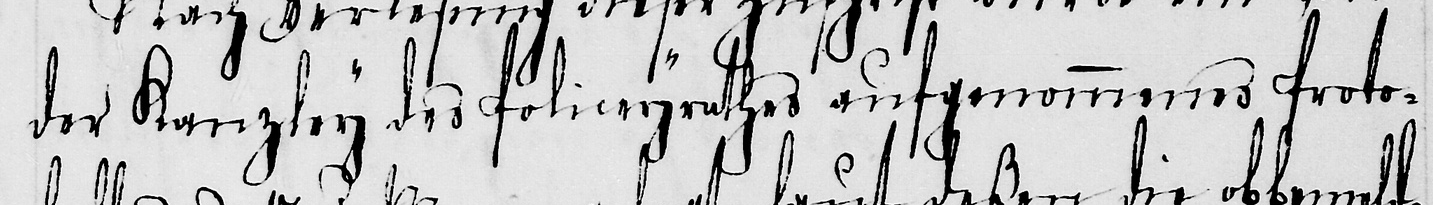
der Kanzley des Policeyrathes aufgenommenes Proto¬
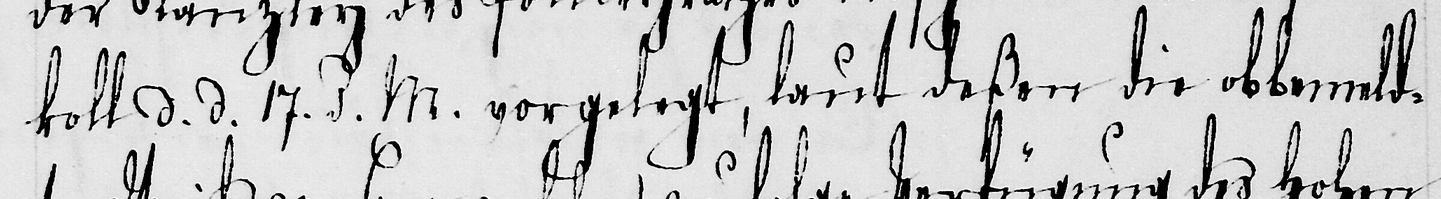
koll d. d. 17. d. M. vorgelegt, laut deßen die obbemeld¬
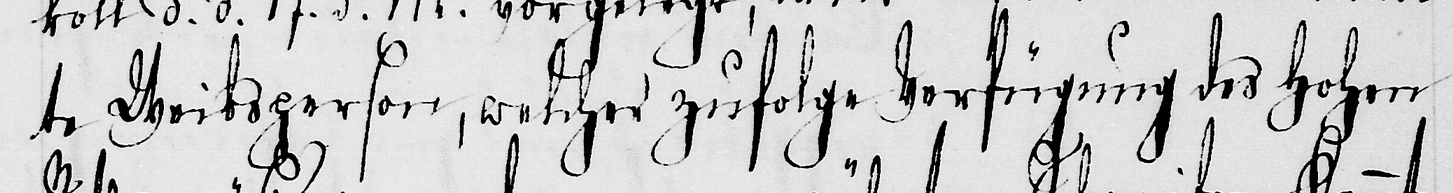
te Weibsperson, welcher zufolge Verfügung des hohen
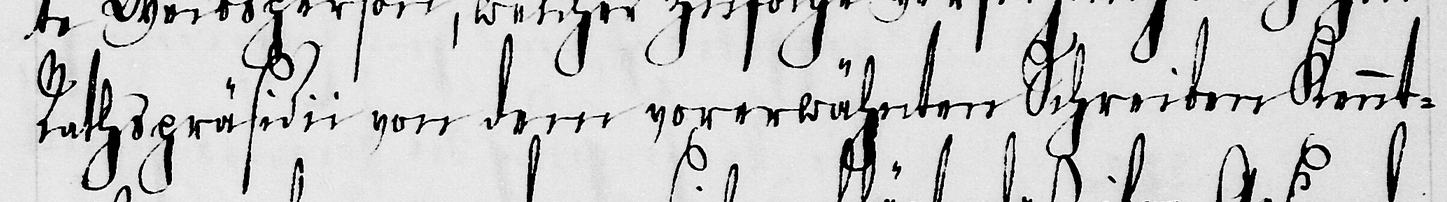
Rathspräsidii von dem vorerwähnten Schreiben Kennt¬
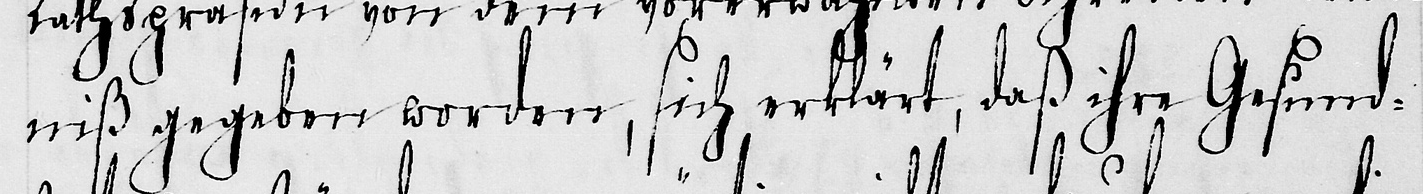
niß gegeben worden, sich erklärt, daß ihre Gesund¬
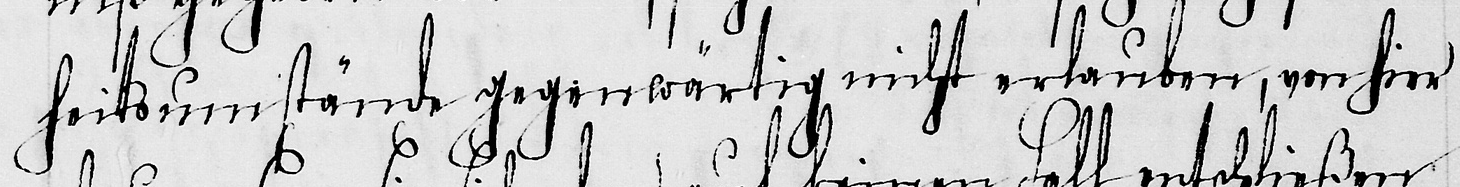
heitsumstände gegenwärtig nicht erlauben, von hier
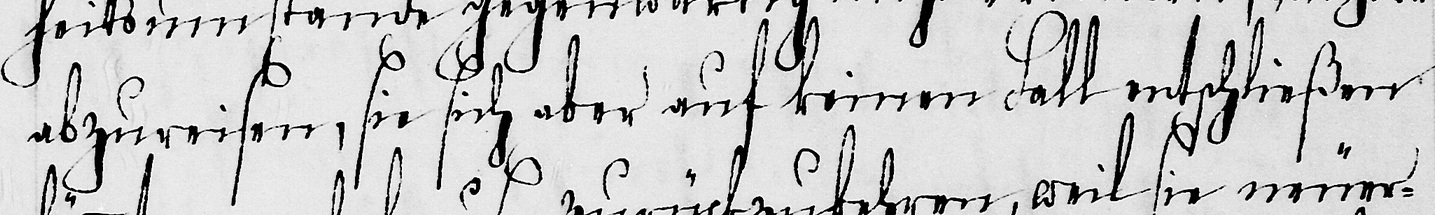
abzureisen, sie sich aber auf keinen Fall entschließen
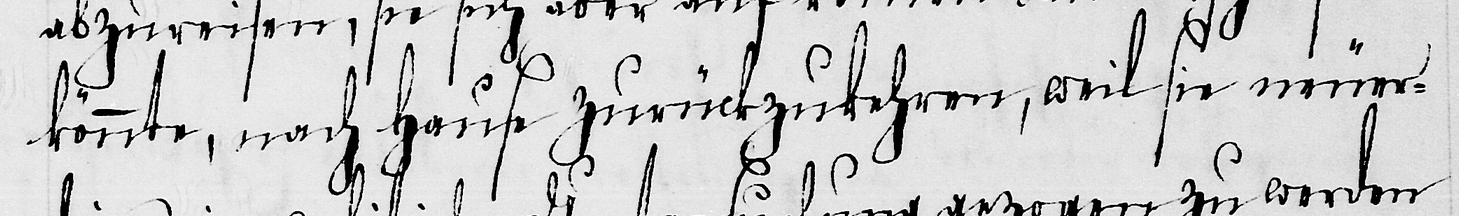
könnte, nach Hause zurückzukehren, weil sie neuer¬
